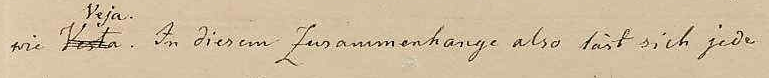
wie VestaVeja. In diesem Zusammenhange also läst sich jede
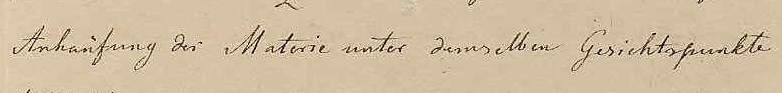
Anhäufung der Materie unter demselben Gesichtspunkte
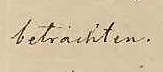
betrachten.
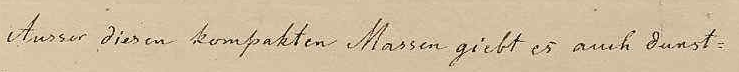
Ausser diesen kompakten Massen giebt es auch dunst-
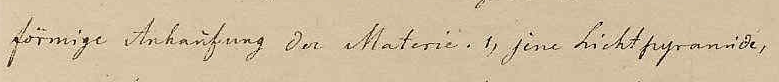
förmige Anhäufungen der Materie. 1, jene Lichtpyramide,
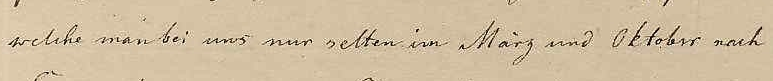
welche man bei uns nur selten im März und Oktober nach
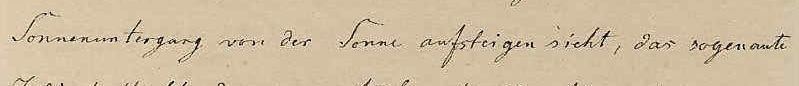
Sonnenuntergang von der Sonne aufsteigen sieht, das sogenante
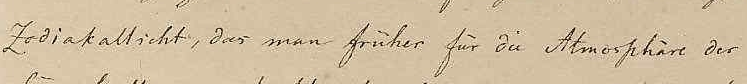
Zodiakallicht, das man früher für die Atmosphäre der
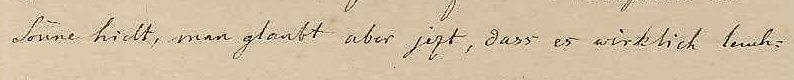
Sonne hielt, man glaubt aber jezt, dass es wirklich leuch-
